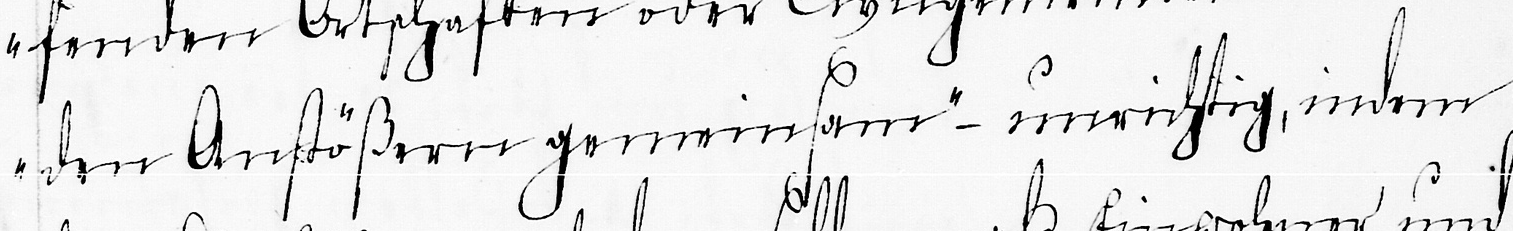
den Anstößern gemeinsam“ – unrichtig, indem
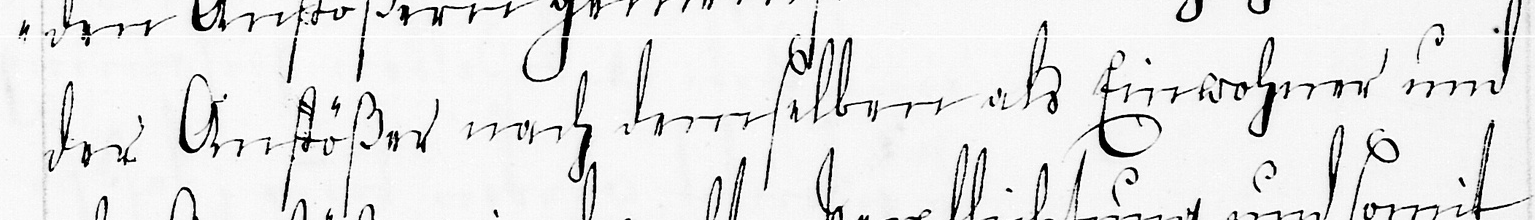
der Anstößer nach demselben als Einwohner und
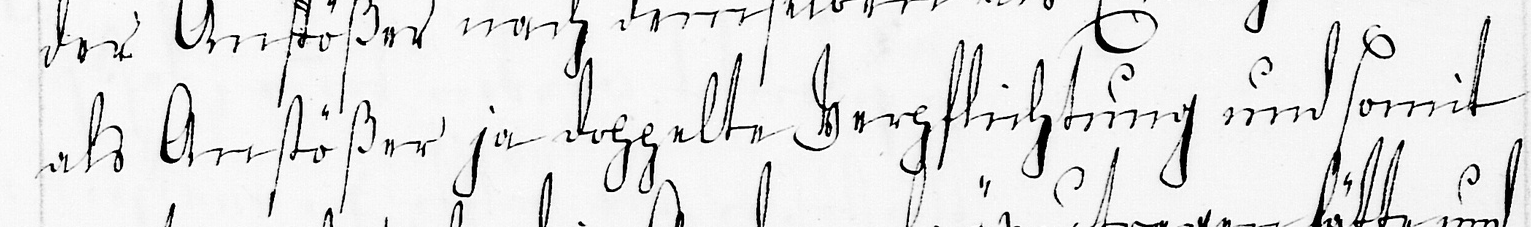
als Anstößer ja doppelte Verpflichtung und somit
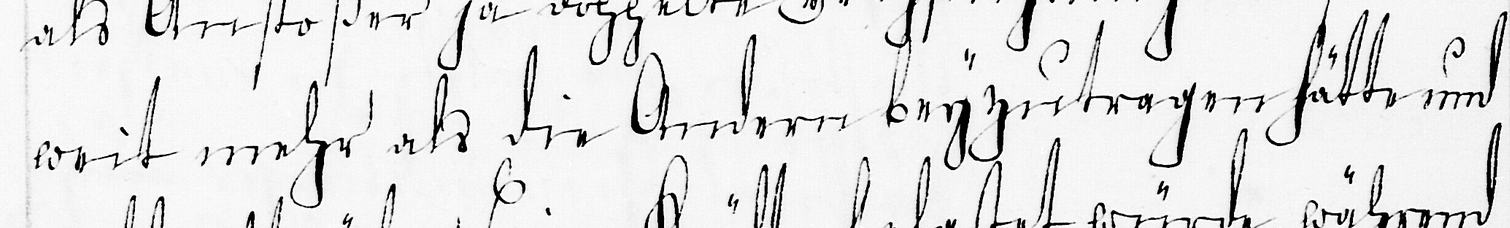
weit mehr als die Andern beyzutragen hätte und
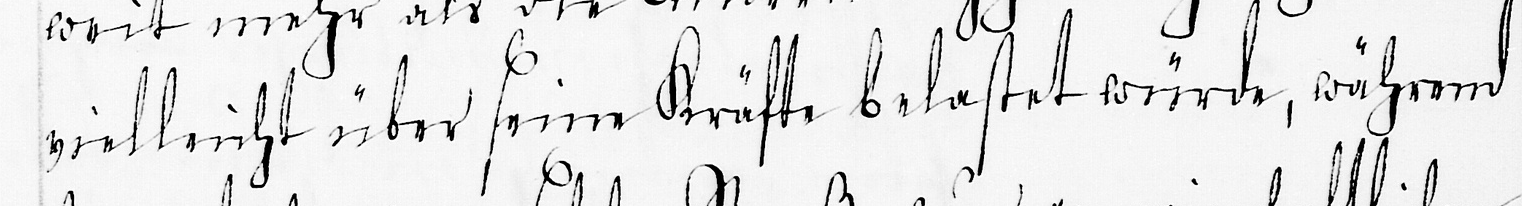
vielleicht über seine Kräfte belastet würde, während
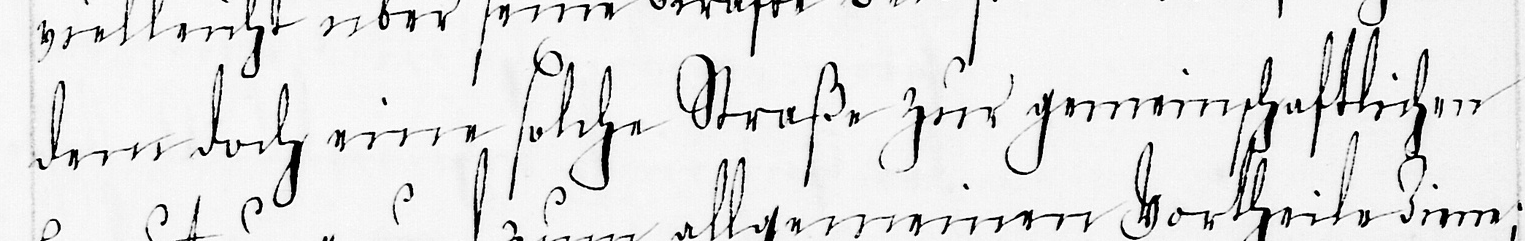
dem doch eine solche Straße zur gemeinschaftlichen
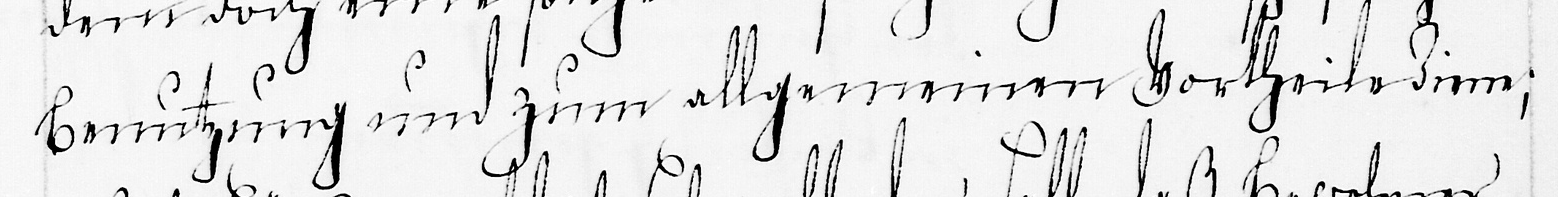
Benutzung und zum allgemeinen Vortheile diene;
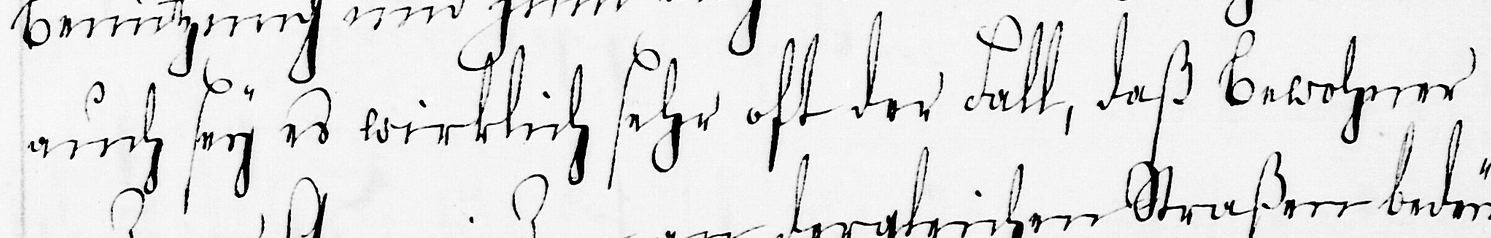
auch sey es wirklich sehr oft der Fall, daß Bewohner
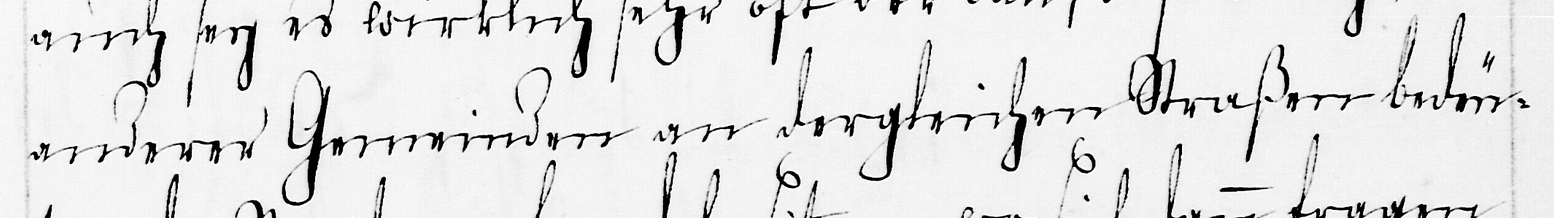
anderer Gemeinden an dergleichen Straßen bedeu¬
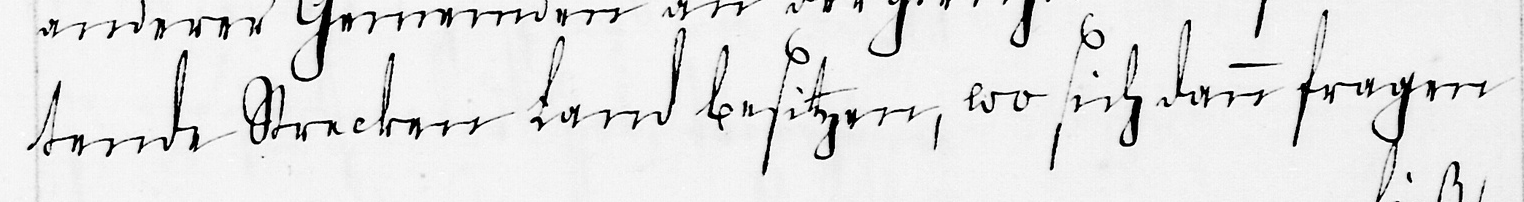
tende Strecken Land besitzen, wo sich dann fragen
